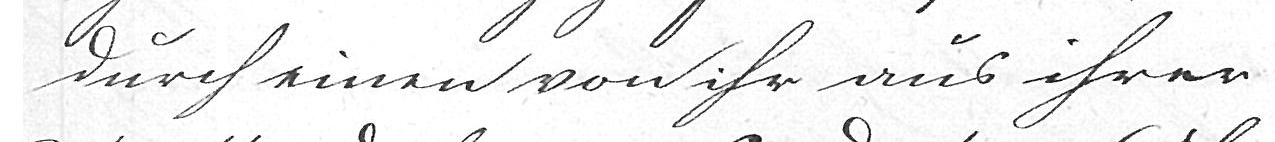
durch einen von ihr aus ihrer
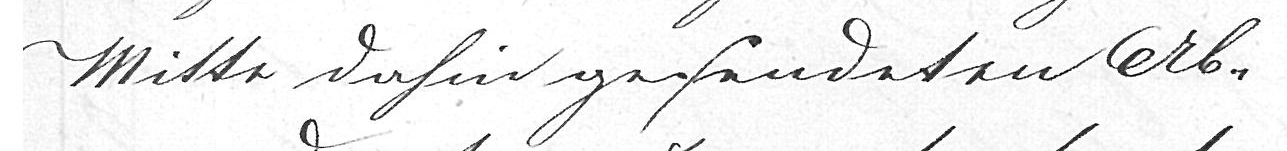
Mitte dahin gesendeten Ab-
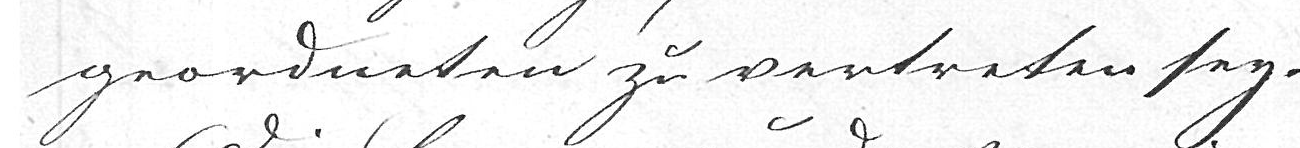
geordneten zu vertreten sey.
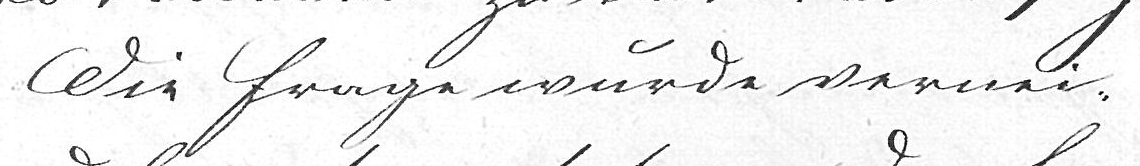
Die Frage wurde vernei-
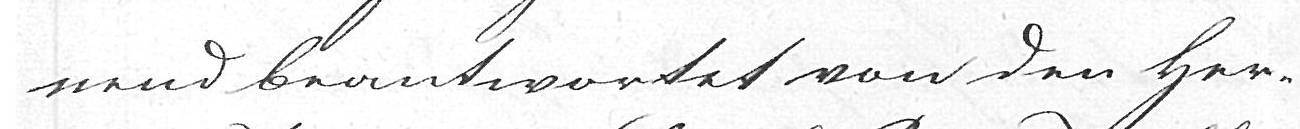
nend beantwortet von den Her-
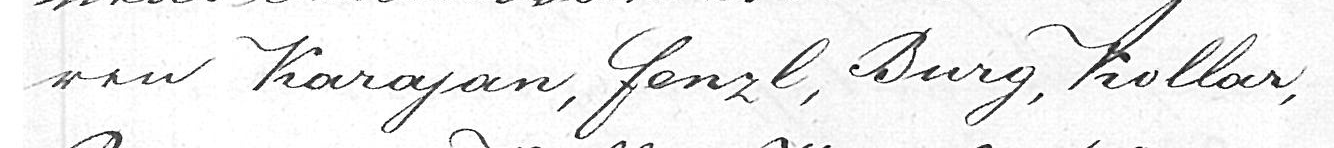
ren Karajan, Fenzl, Burg, Kollar,
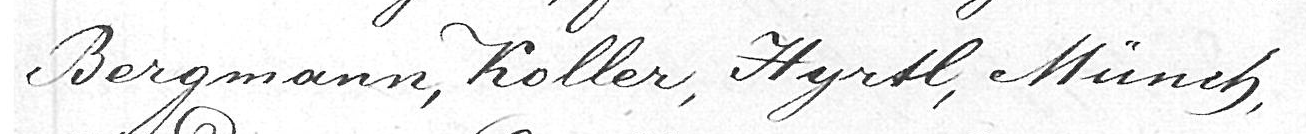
Bergmann, Koller, Hyrtl, Münch,
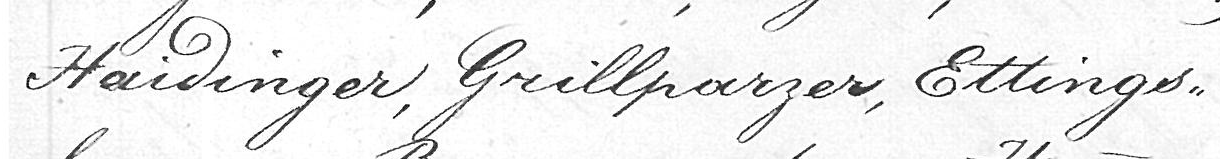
Haidinger, Grillparzer, Ettings-
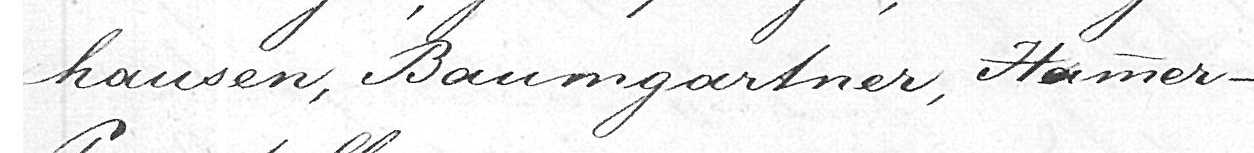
hausen, Baumgartner, Hammer-
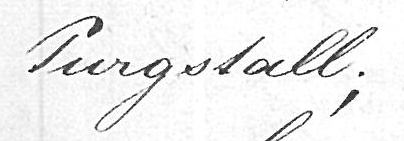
Purgstall;
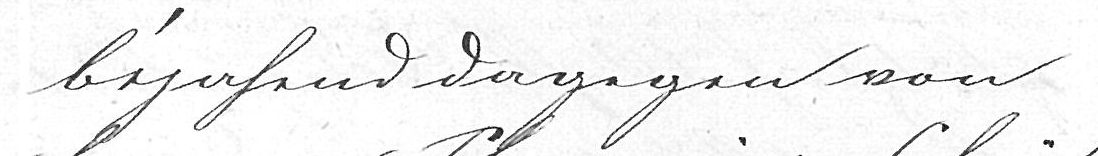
bejahend dagegen von
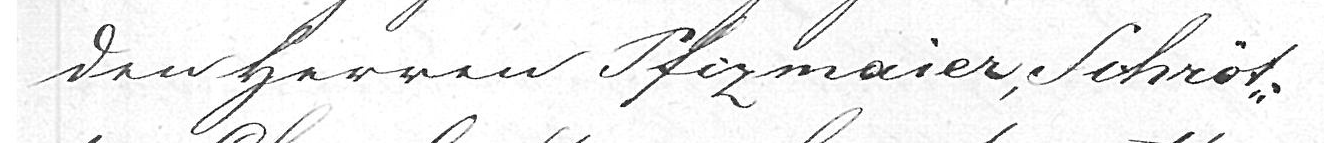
den Herren Pfizmaier Schröt-
